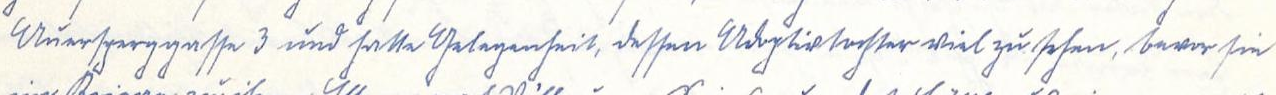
Auersperggasse 3 und hatte Gelegenheit, dessen Adoptivtochter viel zu sehen, bevor sie
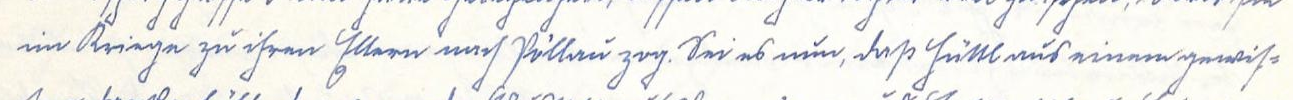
im Kriege zu ihren Eltern nach Pollau zog. Sei es nun, dass Hüttl aus einem gewis-
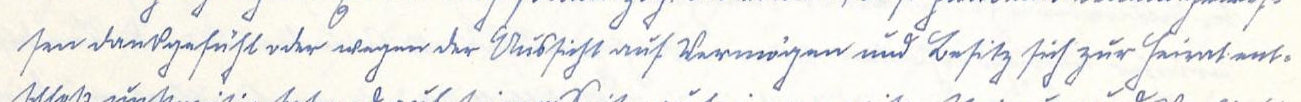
sen Dankgefühl oder wegen der Aussicht auf Vermögen und Besitz sich zur Heirat ent-
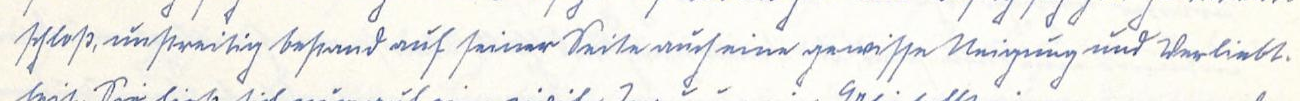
schloß, unstreitig bestand auf seiner Seite auch eine gewisse Neigung und Verliebt-
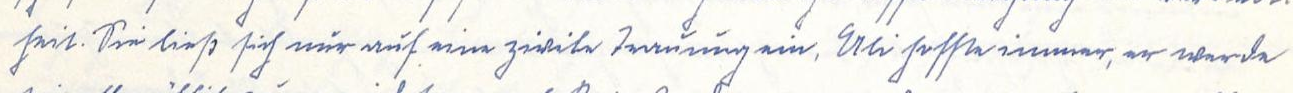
heit. Sie ließ sich nur auf eine zivile Trauung ein, Ali hoffte immer, er werde
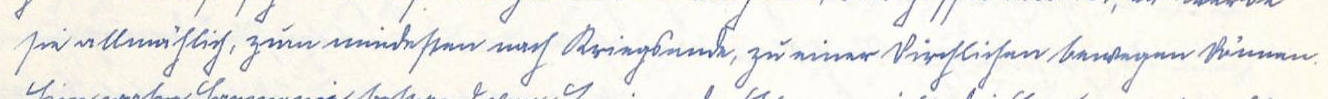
sie allmählich, zum mindesten nach Kriegsande, zu einer kirchlichen bewegen können.
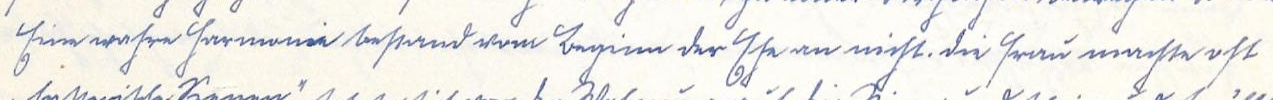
Eine wahre Harmonie bestand vom Beginn der Ehe an nicht. Die Frau machte oft
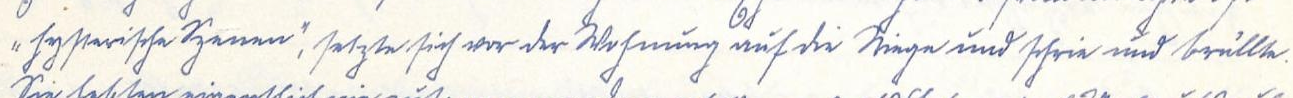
hysterische Szenen, setzte sich vor der Wohnung auf die Stiege und schrie und brüllte.
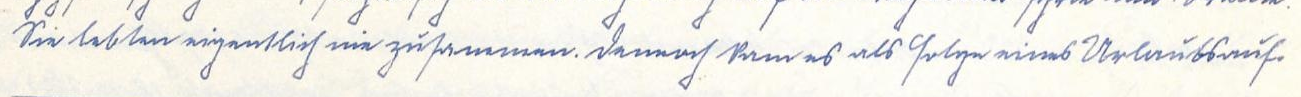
Sie lebten eigentlich nie zusammen. Deneoch kam es als Folge eines Urlaubsauf-
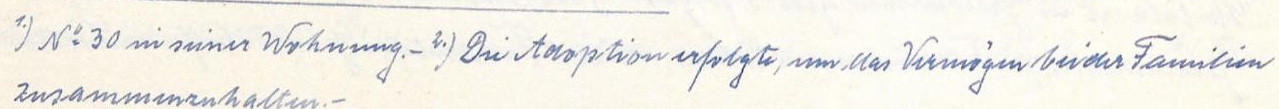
1) No 30 in seiner Wohnung, 2) Die Adoption erfolgte, um das Vermögen beider Familien
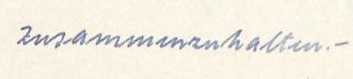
zusammenzuhalten. -
